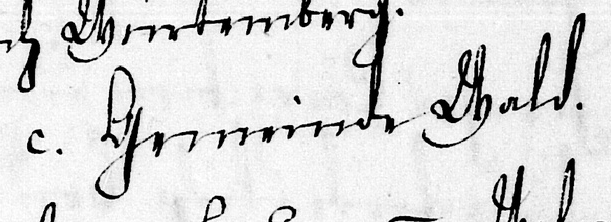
c. Gemeinde Wald.
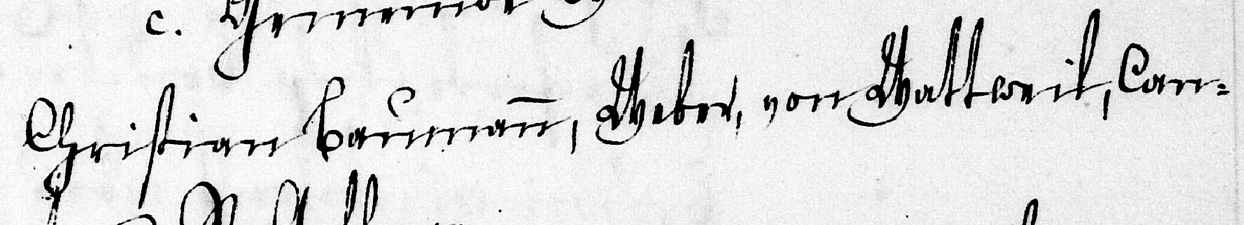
hristian Baumann, Weber, von Wattweil, Can¬
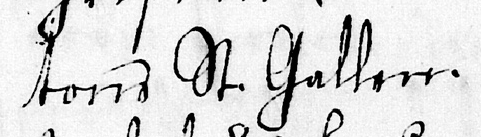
tons St. Gallen.
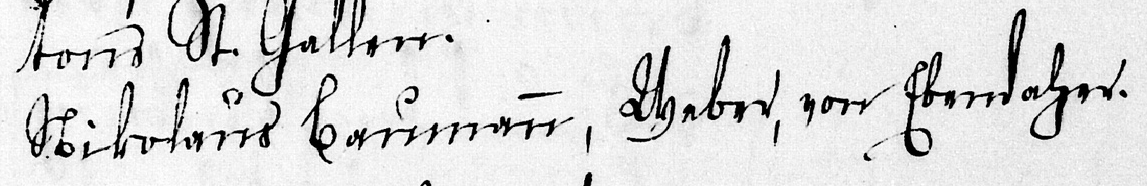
ikolaus Baumann, Weber, von Ebendaher.
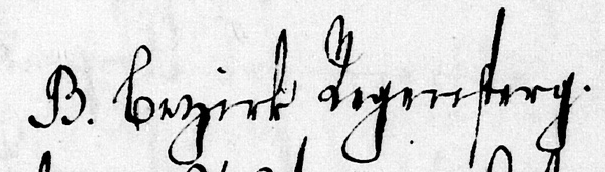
B. Bezirk Regensperg.
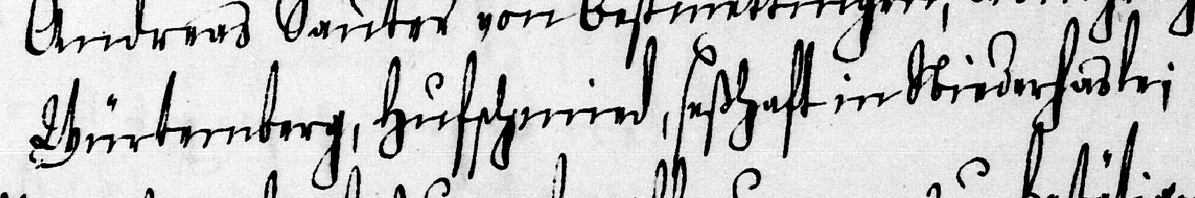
Würtemberg, Hufschmied, seßhaft in Niederhasle;
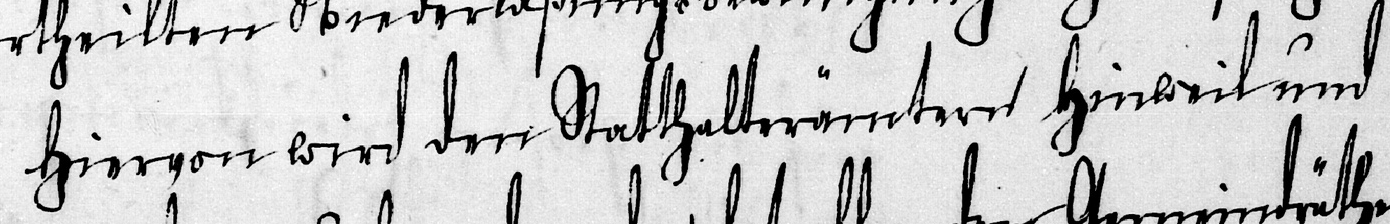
Hiervon wird den Statthalterämtern Hinweil und
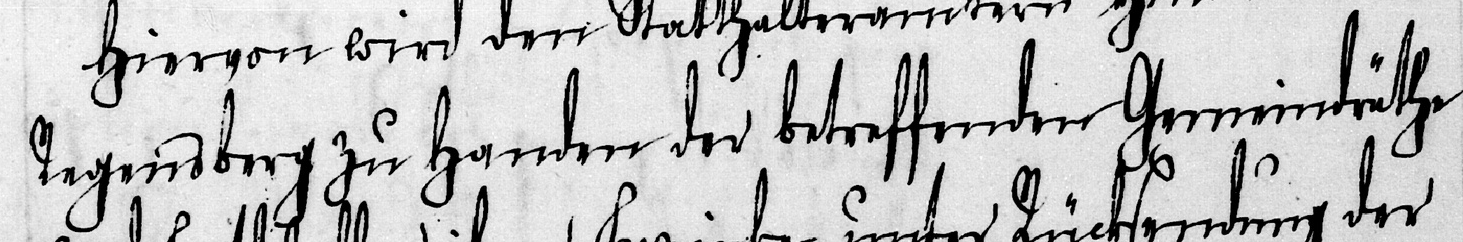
Regensberg zu Handen der betreffenden Gemeindräthe
